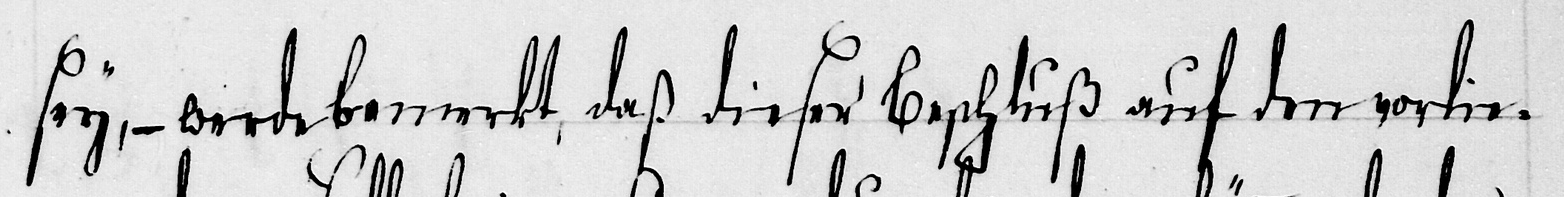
sey, – werde bemerkt, daß dieser Beschluß auf den vorlie¬
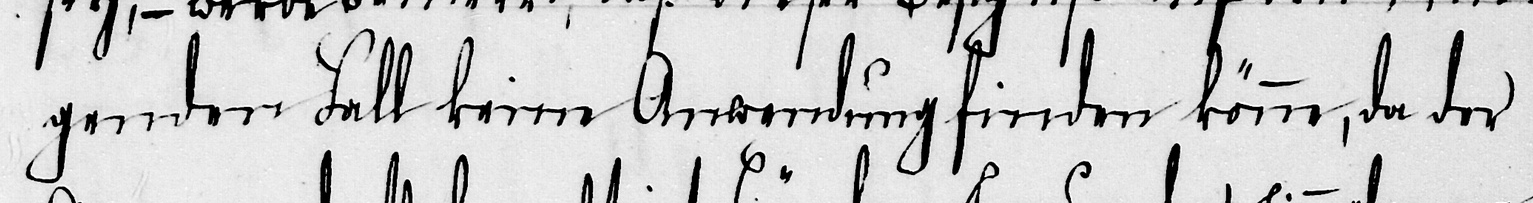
genden Fall keine Anwendung finden könne, da der
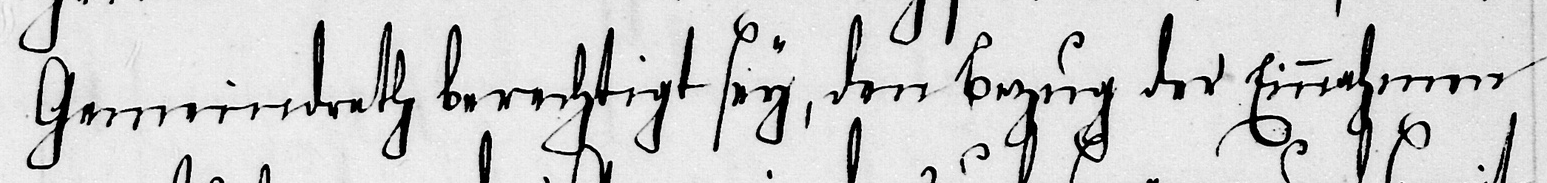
Gemeindrath berechtigt sey, den Bezug der Einnahmen
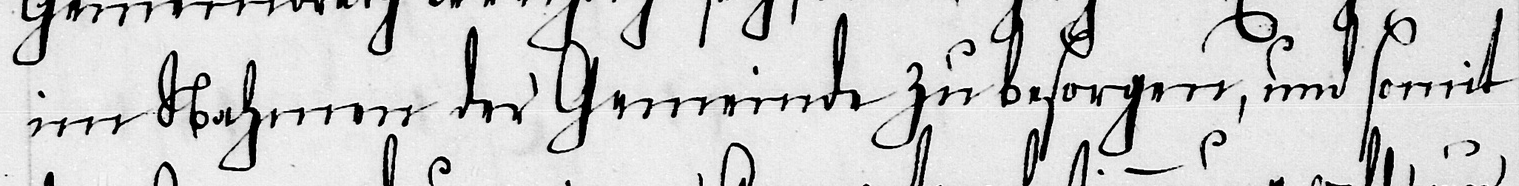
im Nahmen der Gemeinde zu besorgen, und somit
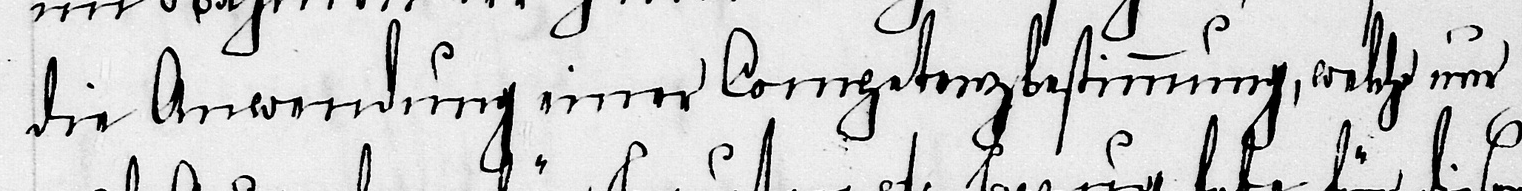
die Anwendung einer Competenzbestimmung, welche nur
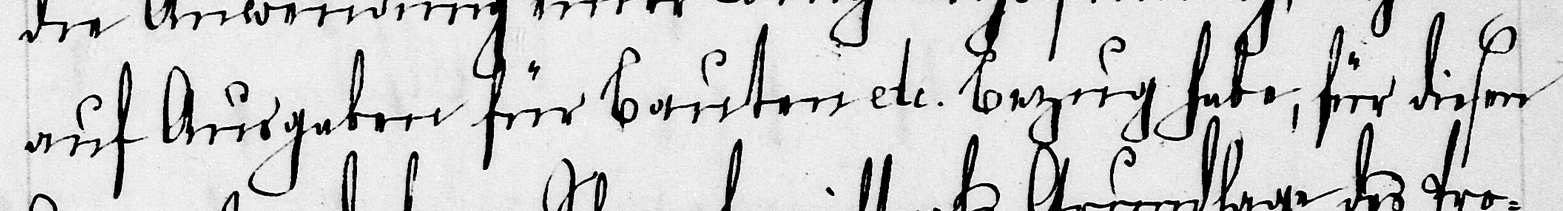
auf Ausgaben für Bauten etc. Bezug habe, für diesen
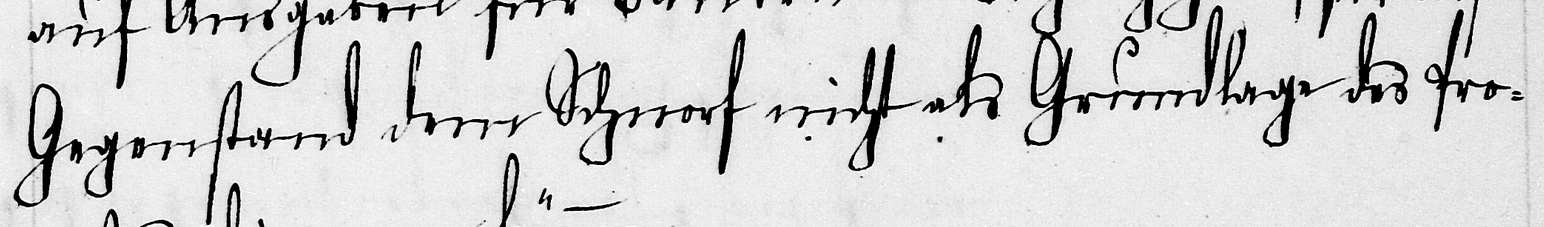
Gegenstand dem Schnorf nicht als Grundlage des Pro¬
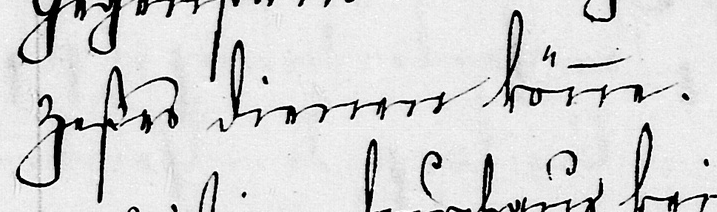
zeßes dienen könne.
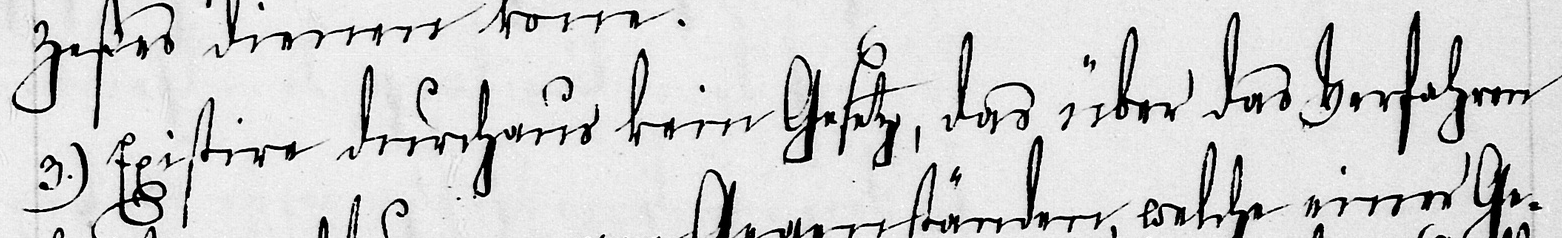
3.) Existire durchaus kein Gesetz, das über das Verfahren
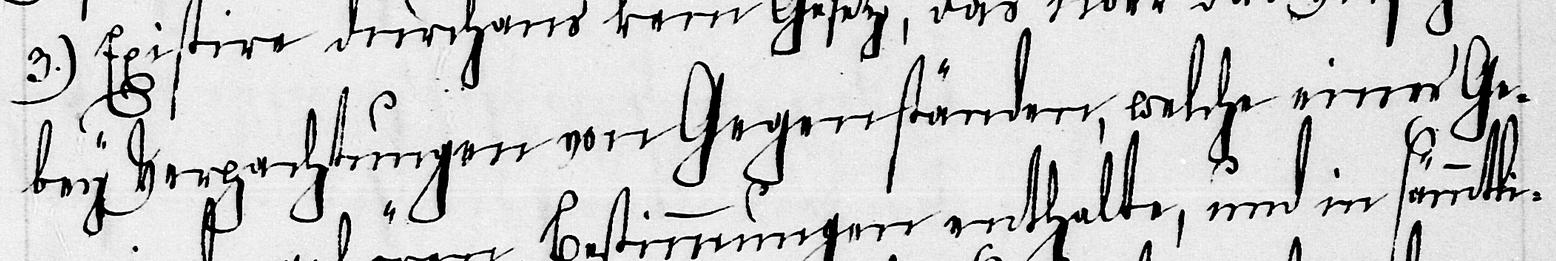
bey Verpachtungen von Gegenständen, welche einer Ge¬
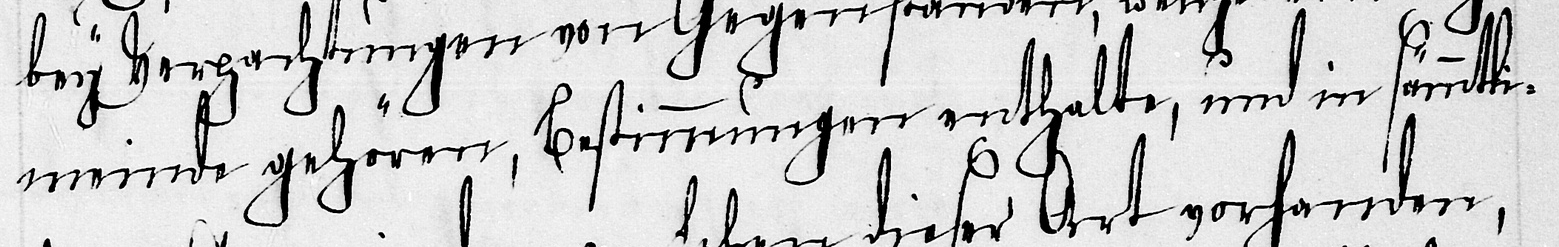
meinde gehören, Bestimmungen enthalte, und in sämmtli¬
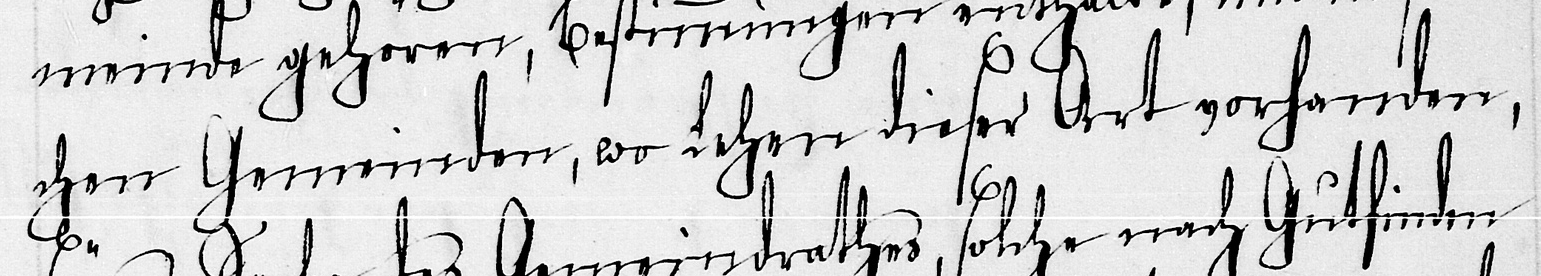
chen Gemeinden, wo Lehen dieser Art vorhanden,
